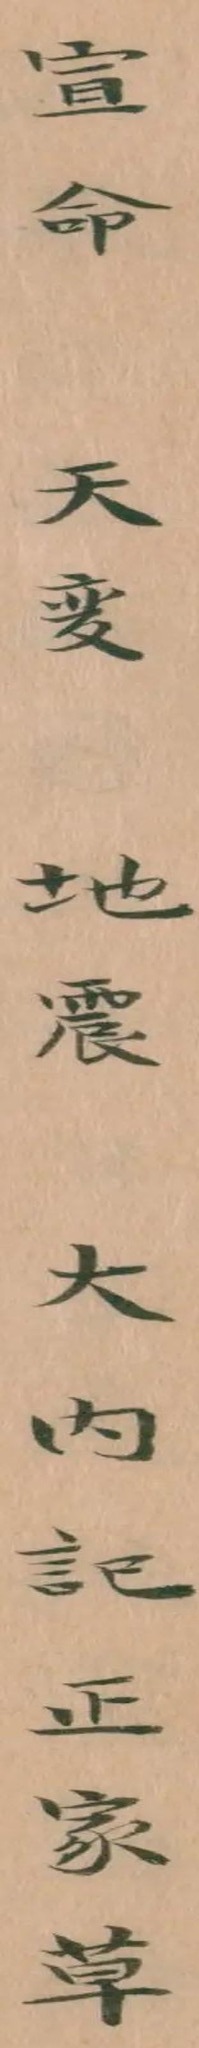宣命天変地震大内記正家草
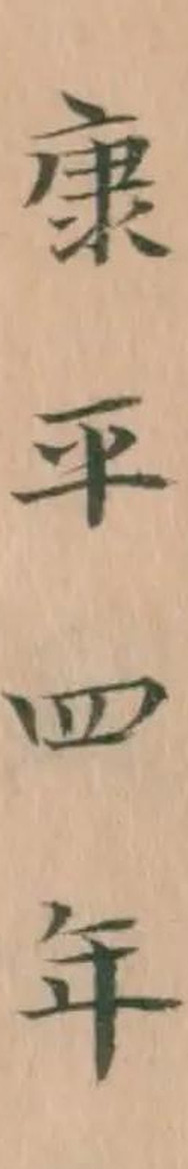康平四年
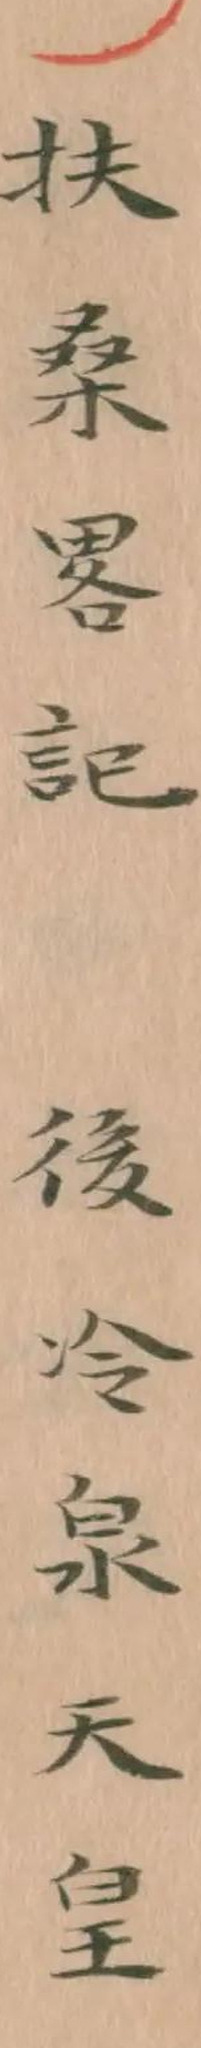○扶桑略記後冷泉天皇
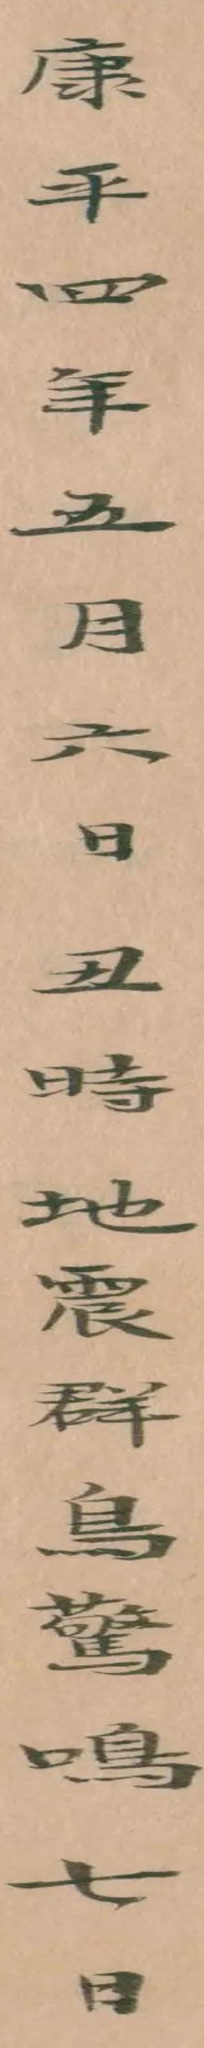康平四年五月六日丑時地震群鳥驚鳴七日
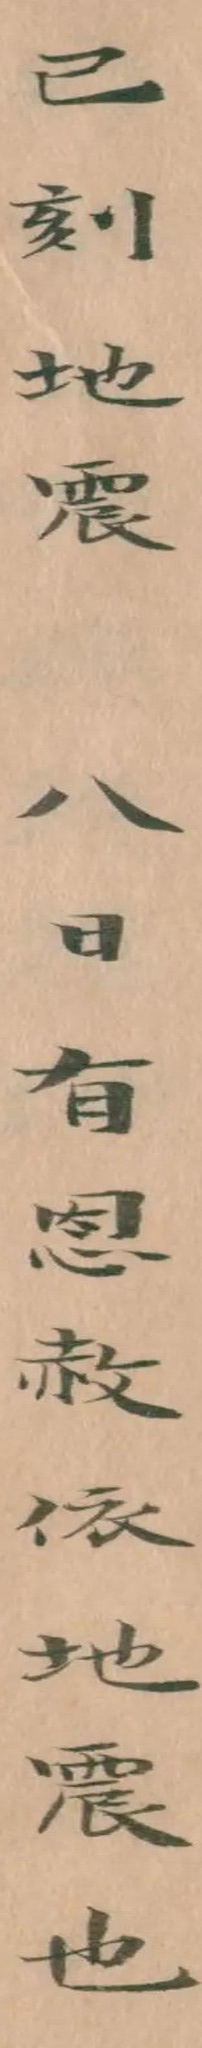巳刻地震八日有恩赦依地震也

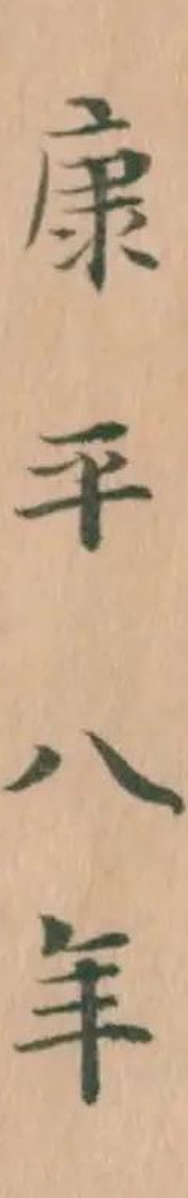康平八年
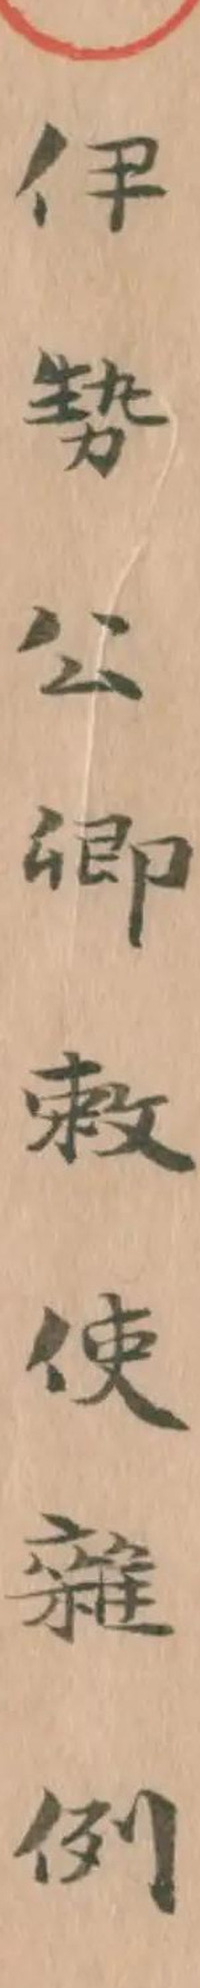○伊勢公卿勅使雑例
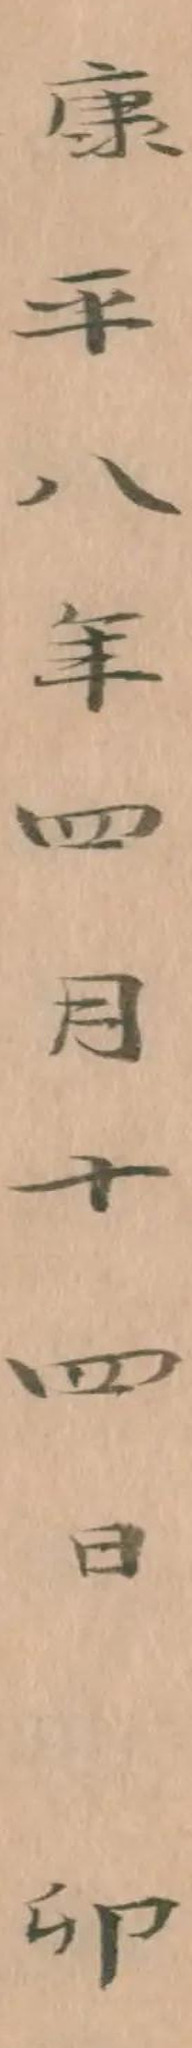康平八年四月十四日卯
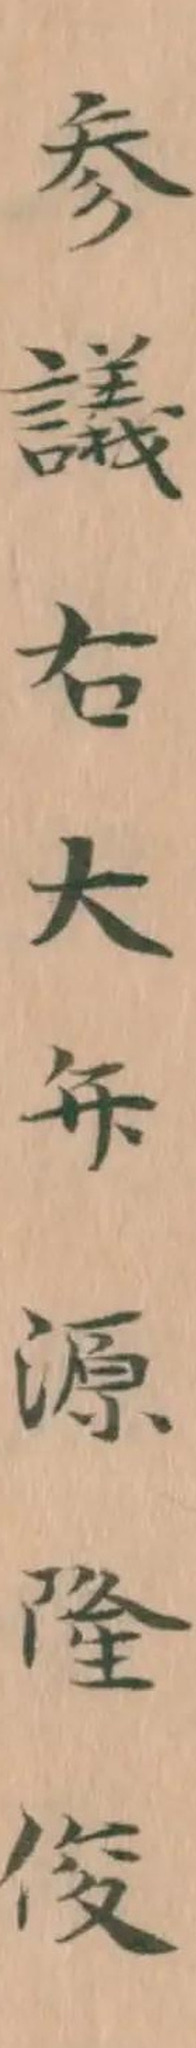参議右大弁源隆俊
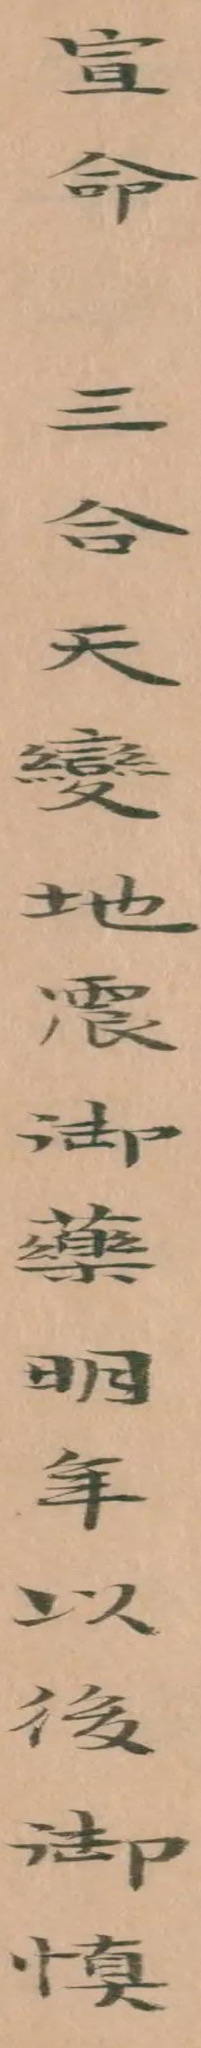宣命三合天変地震御薬明年以後御慎
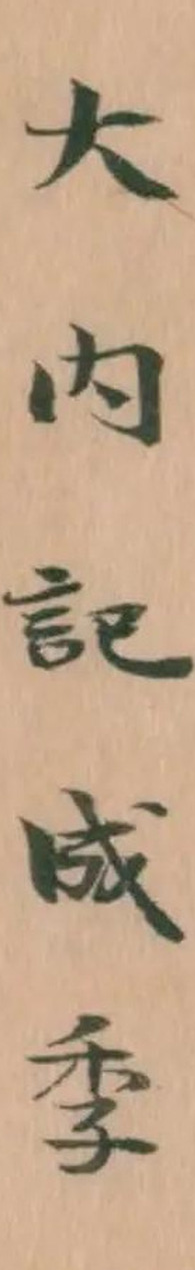大内記成季
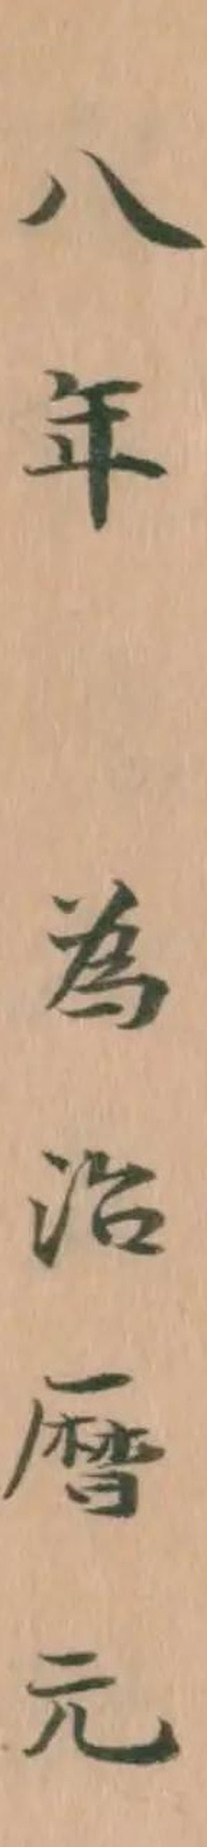同八年為治暦元
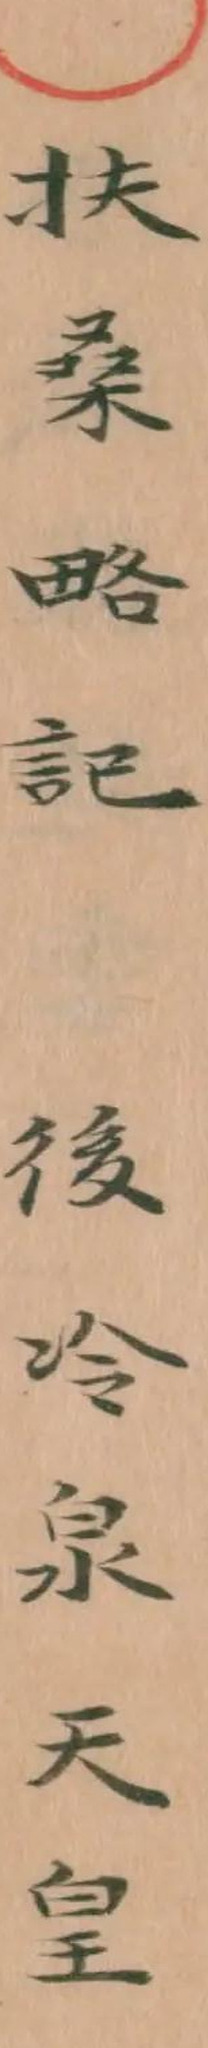○扶桑略記後冷泉天皇
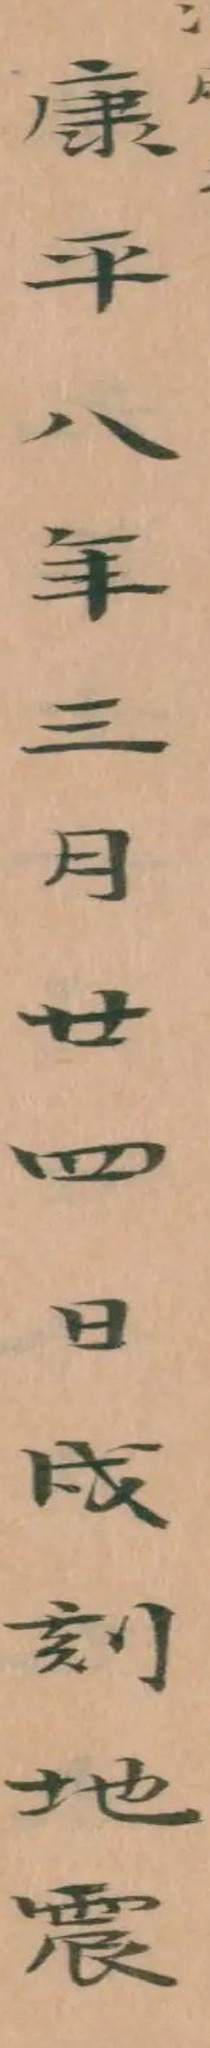康平八年三月廿四日戌刻地震
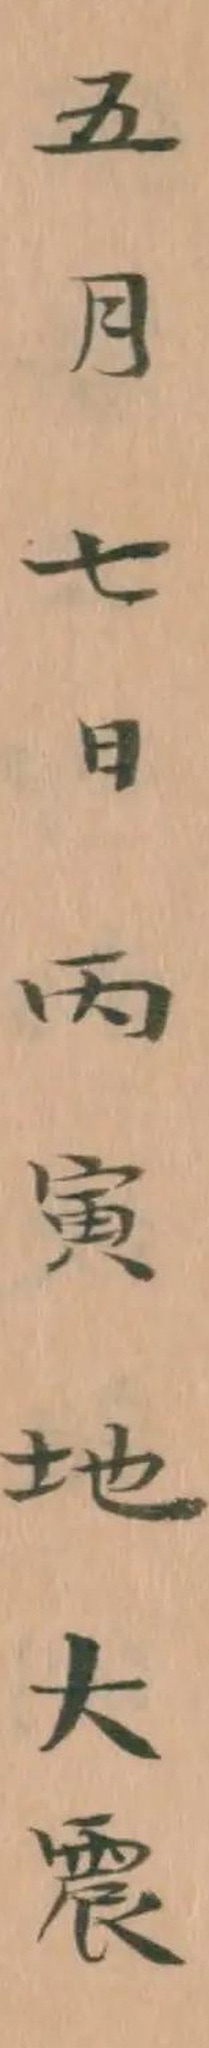五月七日丙寅地大震
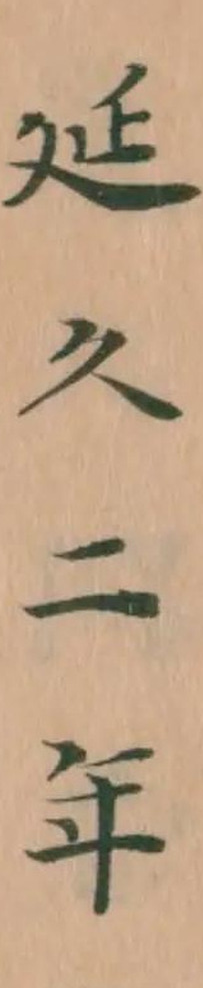延久二年
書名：地災撮要. 巻5-6(地震之部)
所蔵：国立国会図書館 National Diet Library, JAPAN
